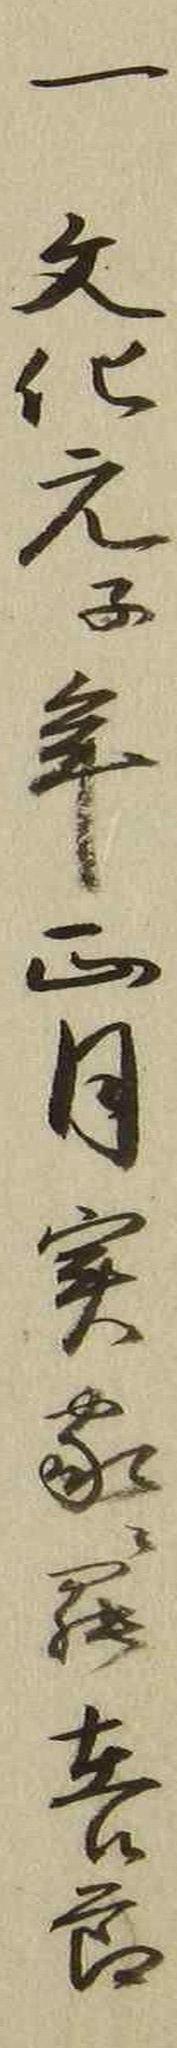一文化元子年正月実家ニ罷在候節
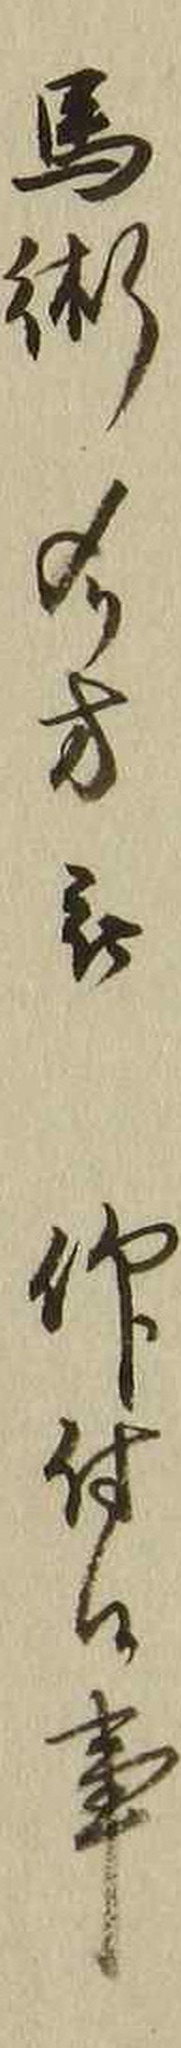馬術〆り方被仰付候事
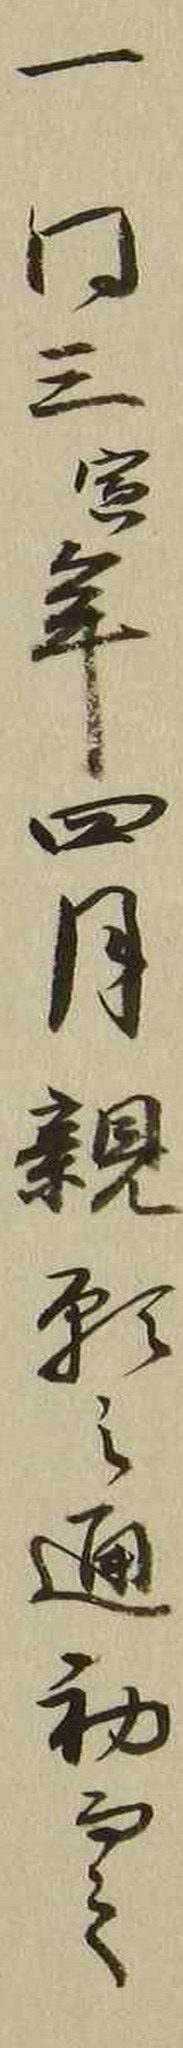一同三寅年四月親願之通初而之
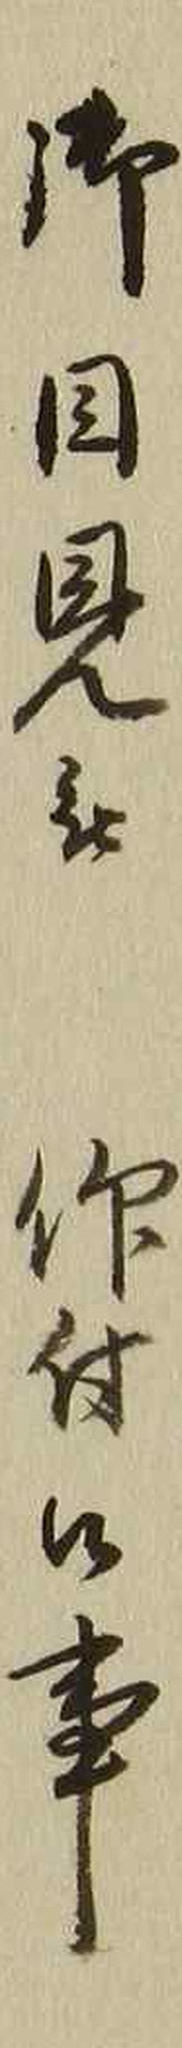御目見被仰付候事
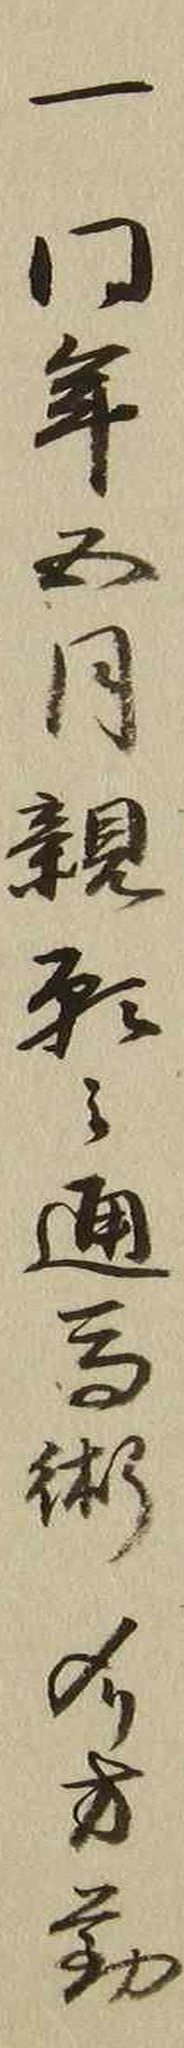一同年五月親願之通馬術〆り方勤
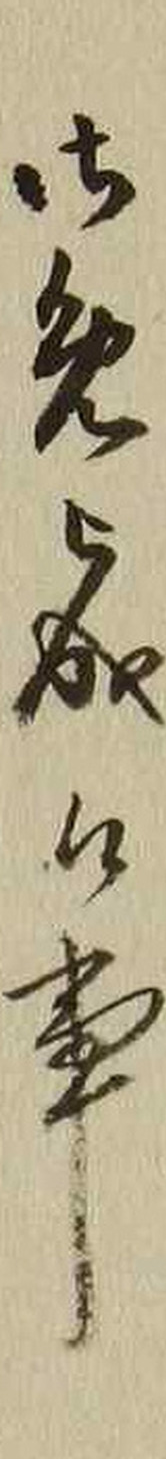御免被成候事
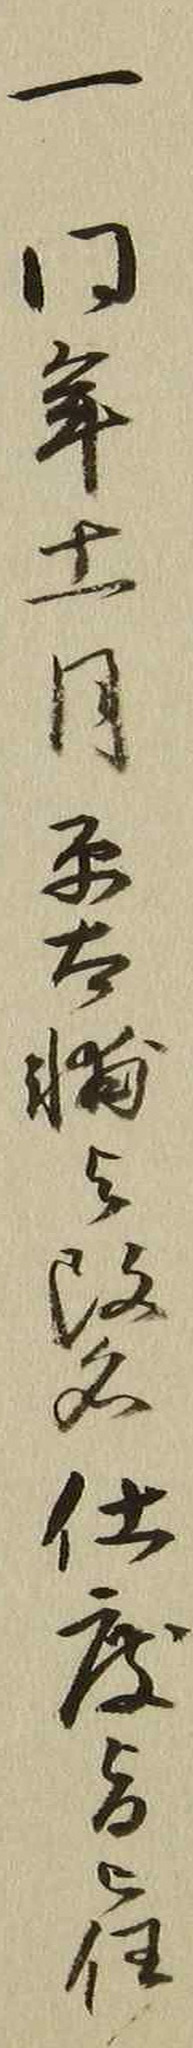一同年十一月平太輔与改名仕度旨被任
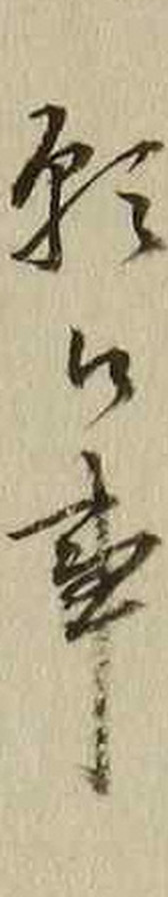願候事
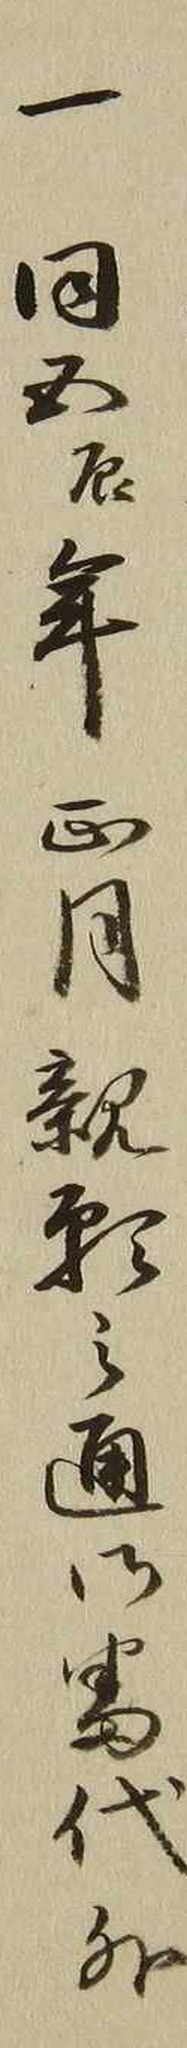一同五辰年正月親願之通御番代外
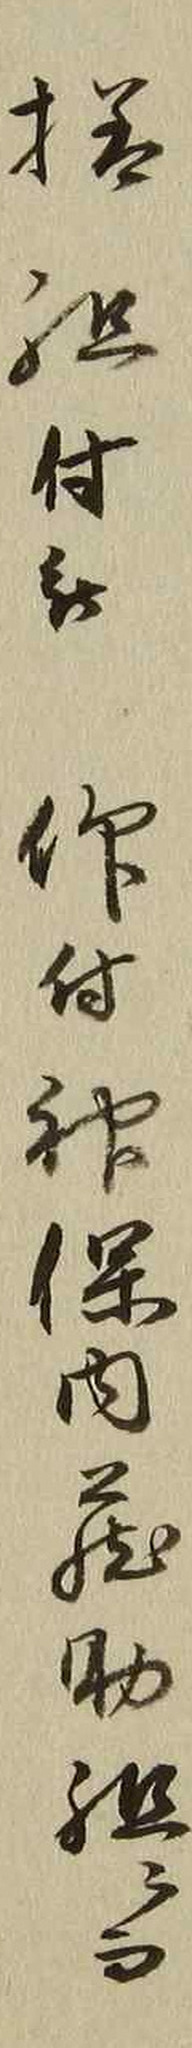様組付被仰付神保内蔵助組ニ而
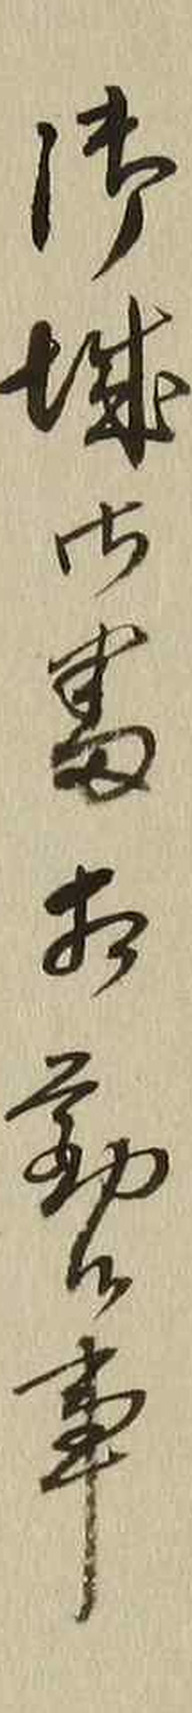御城御番相勤候事
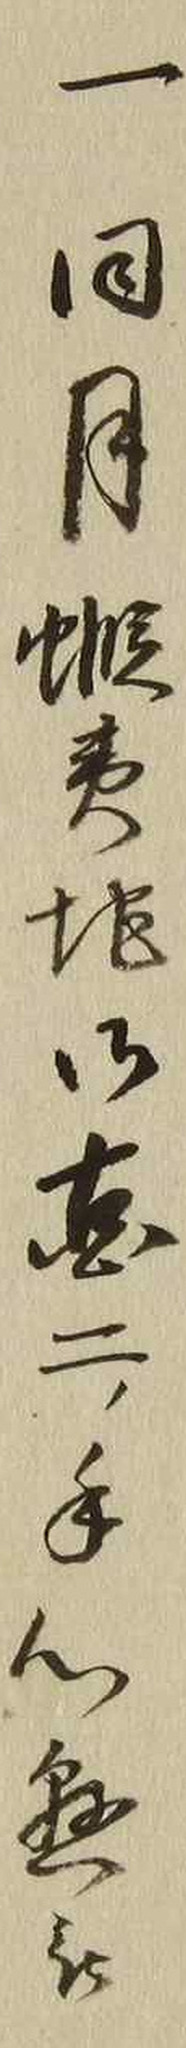一同月蝦夷地御固二ノ手心懸被
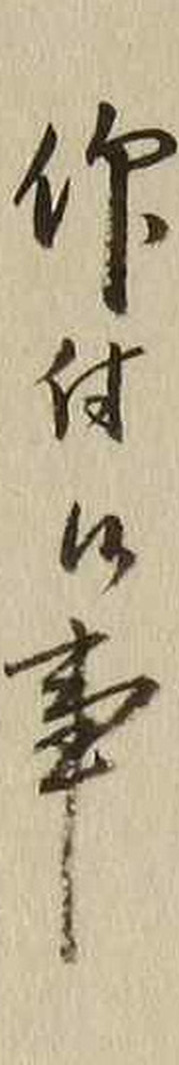仰付候事
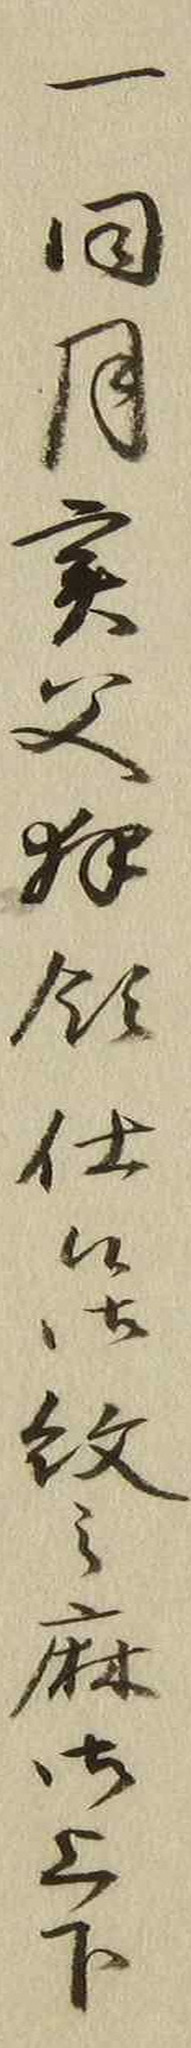一同月実父拝領仕候御紋之麻御上下
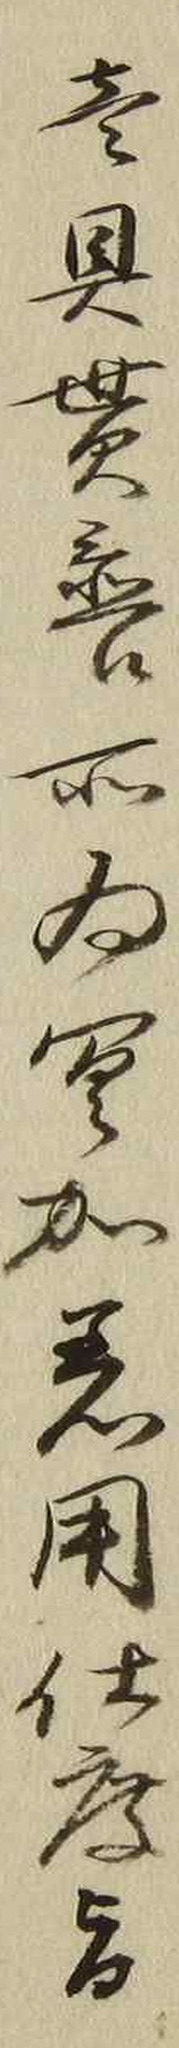壱具貰置候所為冥加着用仕度旨
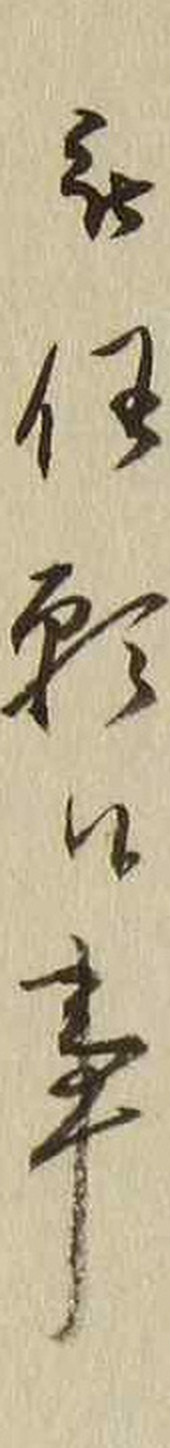被任願候事
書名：諸士系譜　巻之128　た之部4
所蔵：会津若松市立会津図書館
